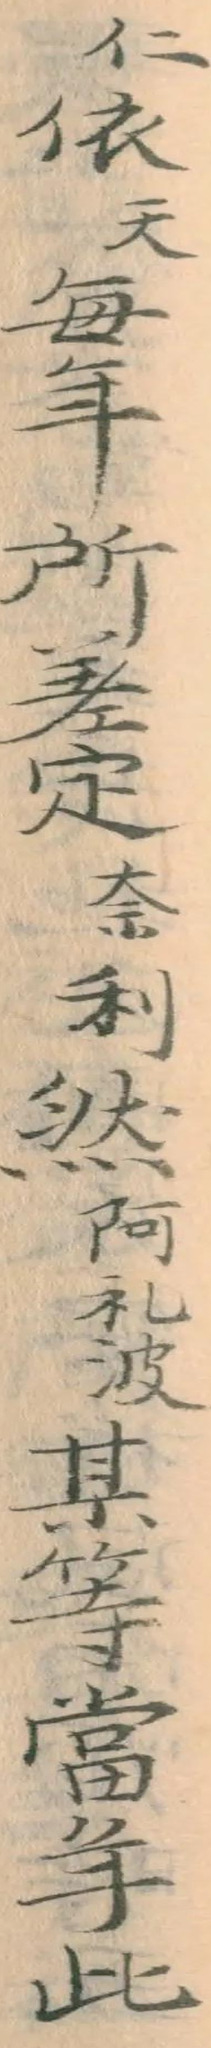仁依天毎年所差定奈利然阿礼波某等當年此
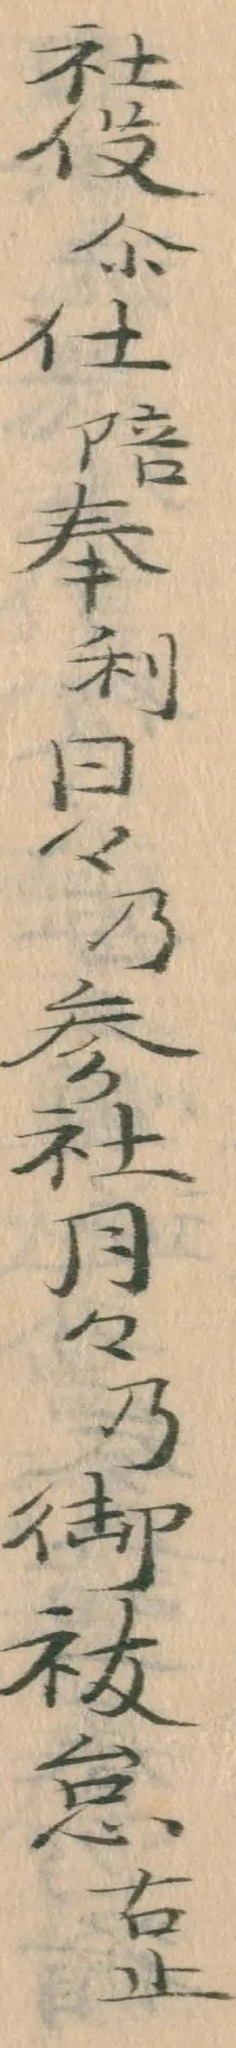社役尒仕陪奉利日々乃参社月々乃御祓怠古止
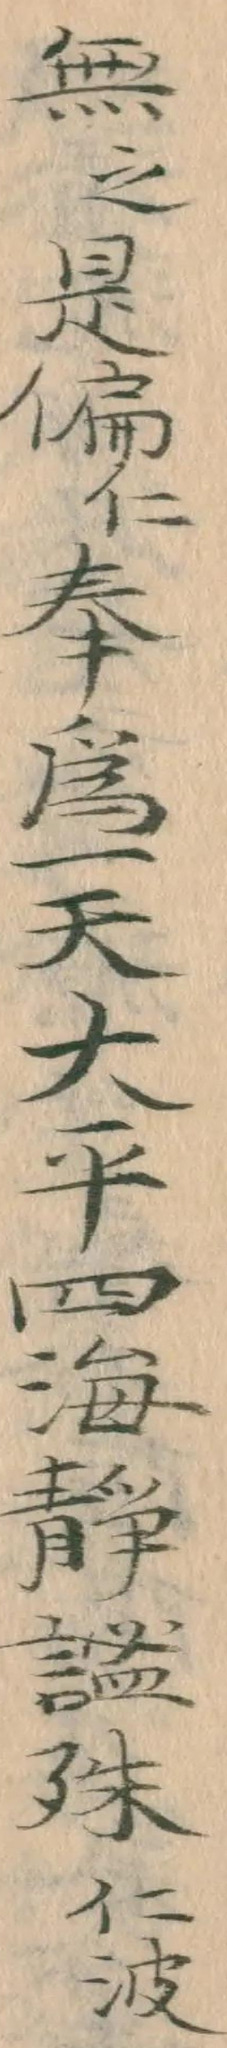無之是偏ニ奉為一天太平四海静謐殊仁波
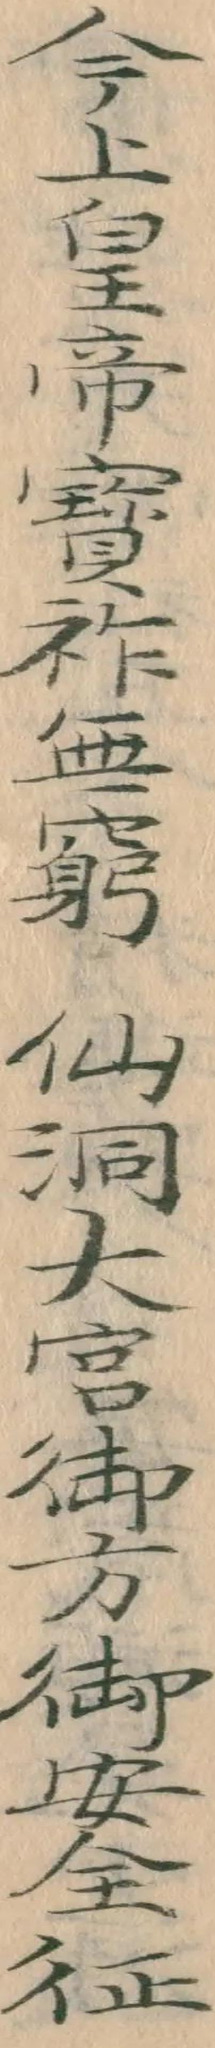今上皇帝寶祚無窮仙洞大宮御方御安全征
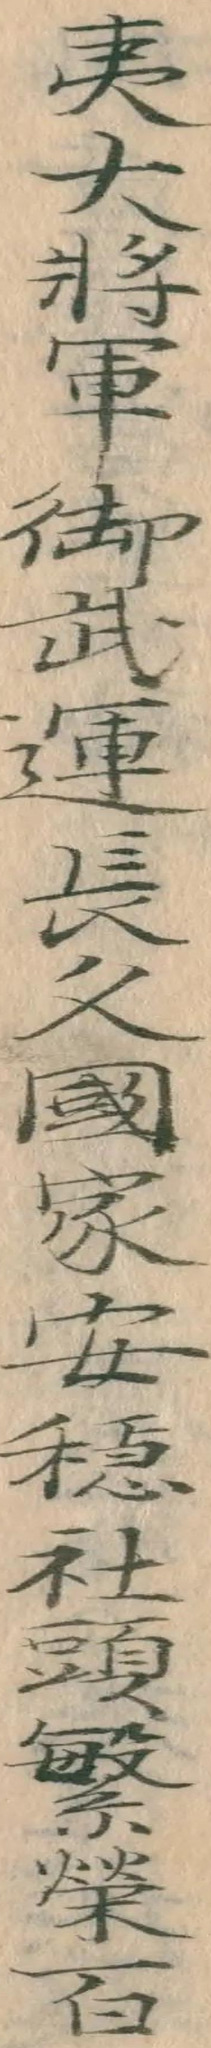夷大将軍御武運長久國家安穏社頭繁榮百
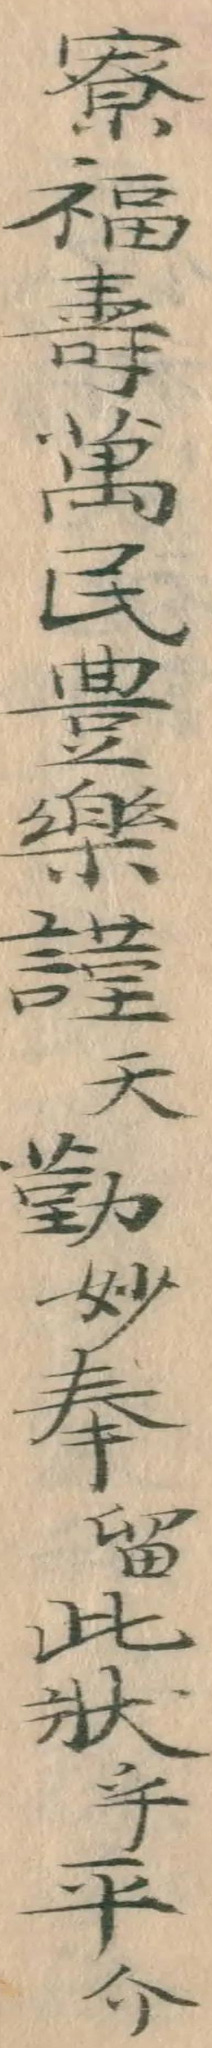寮福壽萬民豊楽謹天勤妙奉留此状乎平介
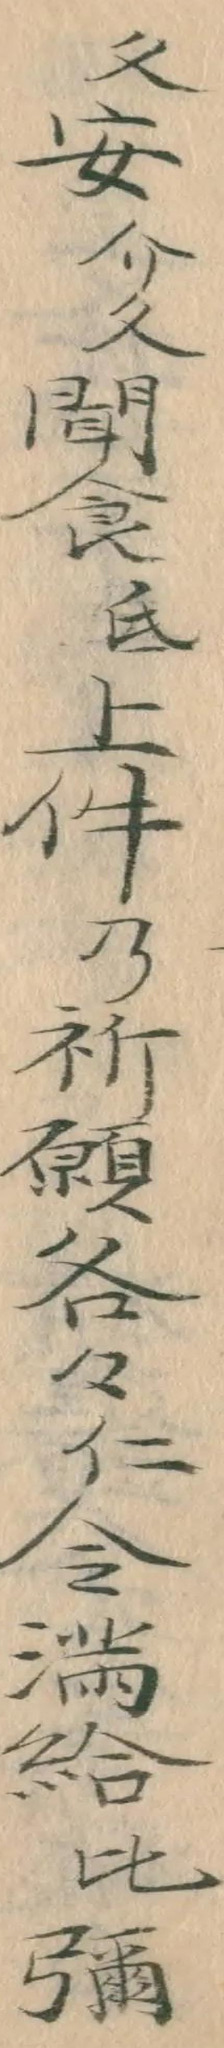又安介久聞食氐上件乃祈願各々仁令満給比彌
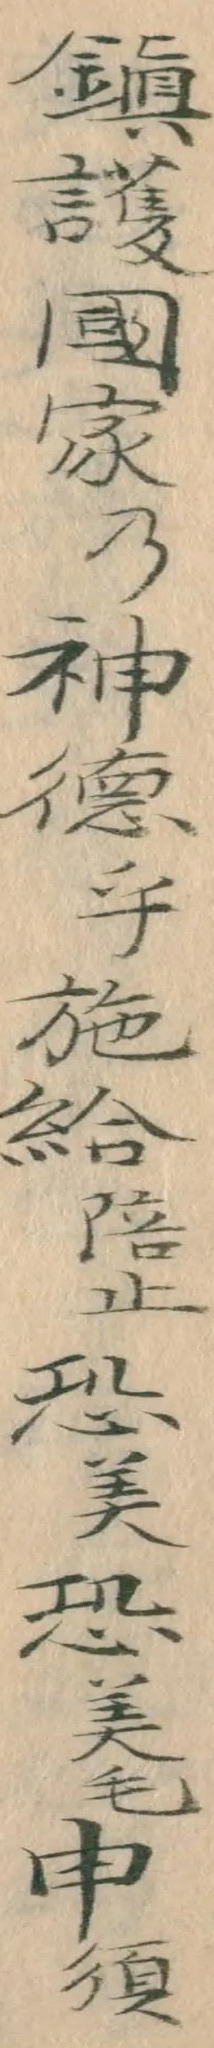鎮護國家乃神徳乎施給陪止恐美恐美毛申須
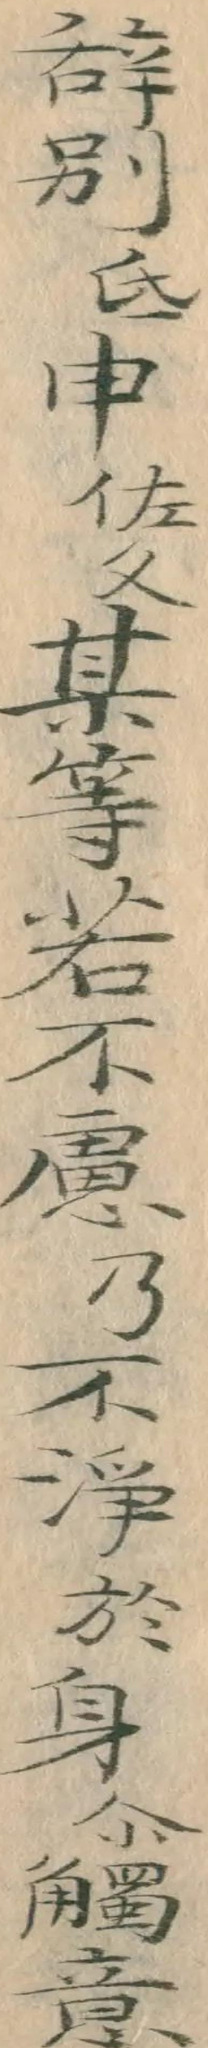辞別氐申佐久某等若不慮乃不浄於身尒触意
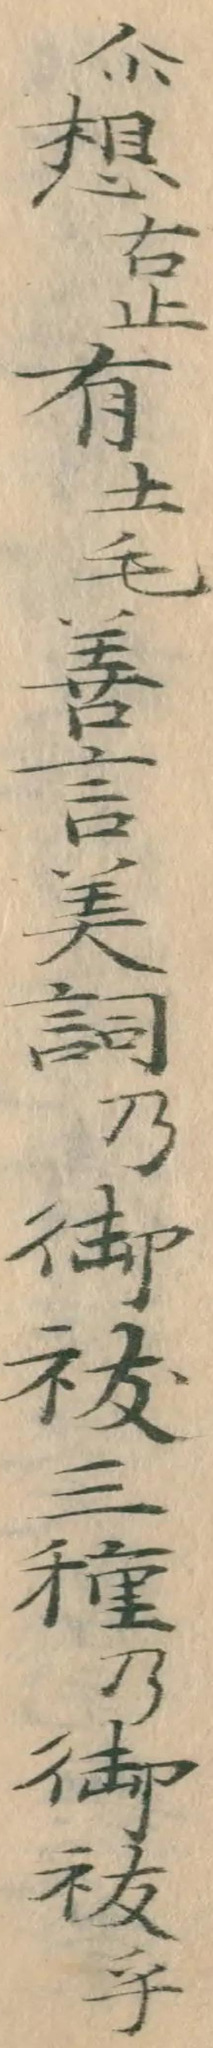尒想古止有土毛善言美詞乃御祓三種乃御祓乎

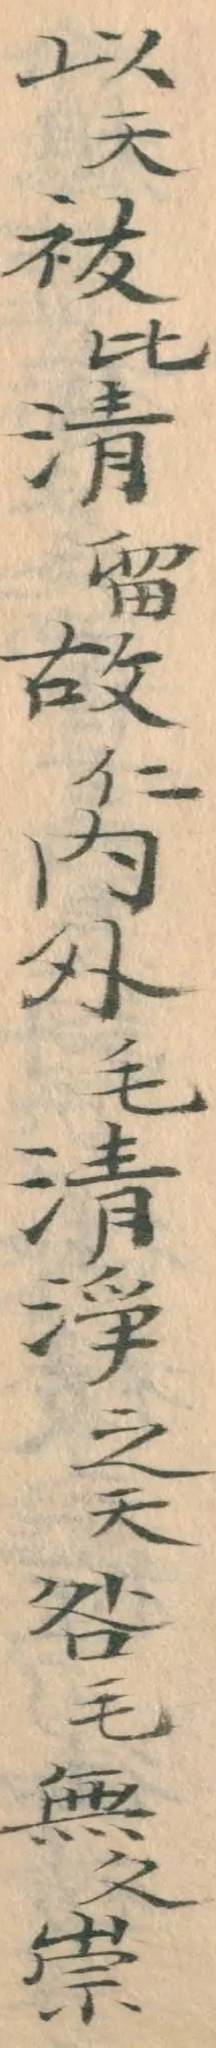以天祓比清留故仁内外毛清浄之天咎毛無久崇
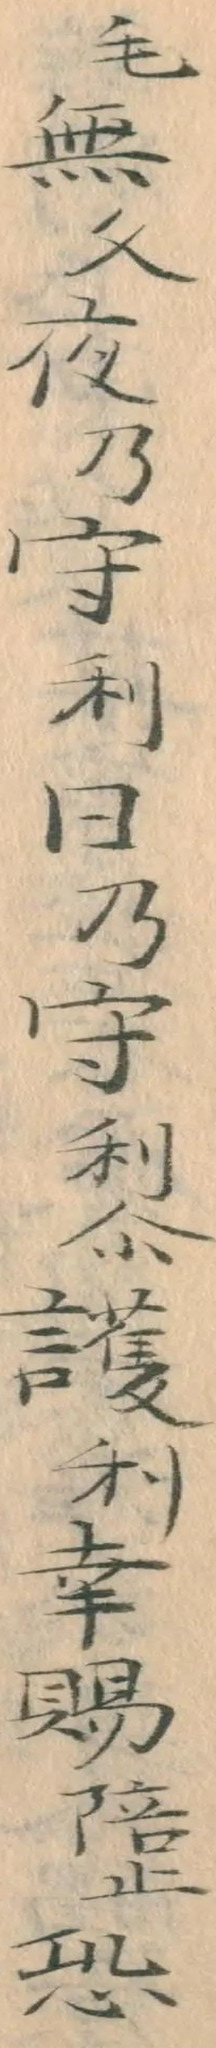毛無久夜乃守利日乃守利尒護利幸賜陪止恐
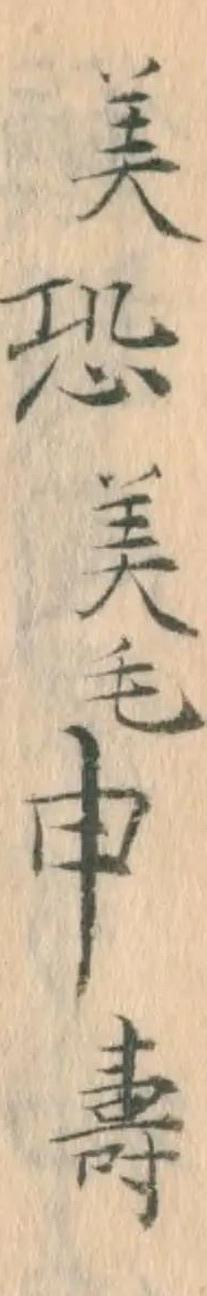美恐美毛申壽
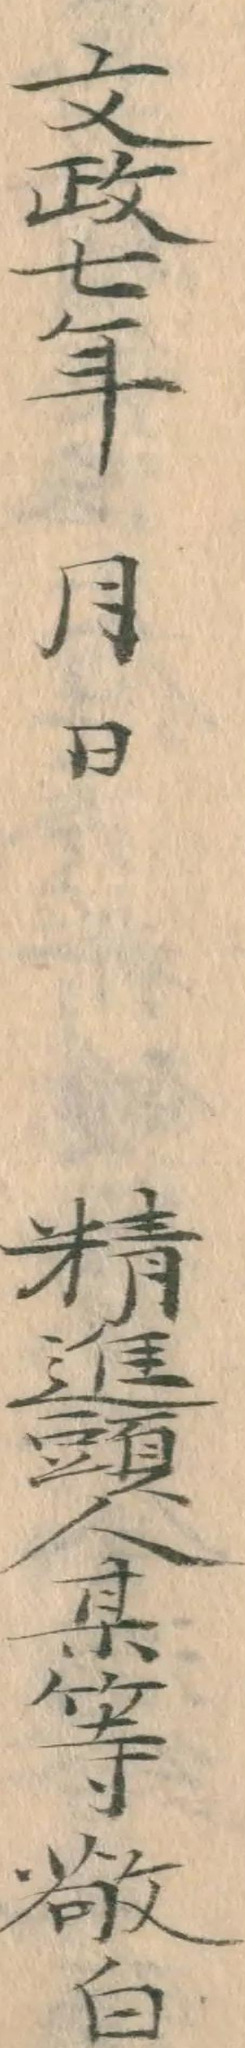文政七年月日精進頭人等敬白
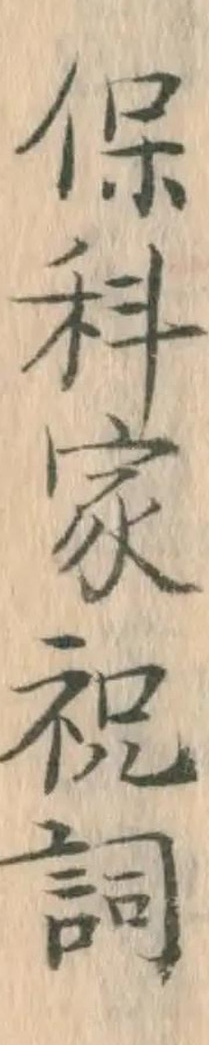保科家祝詞
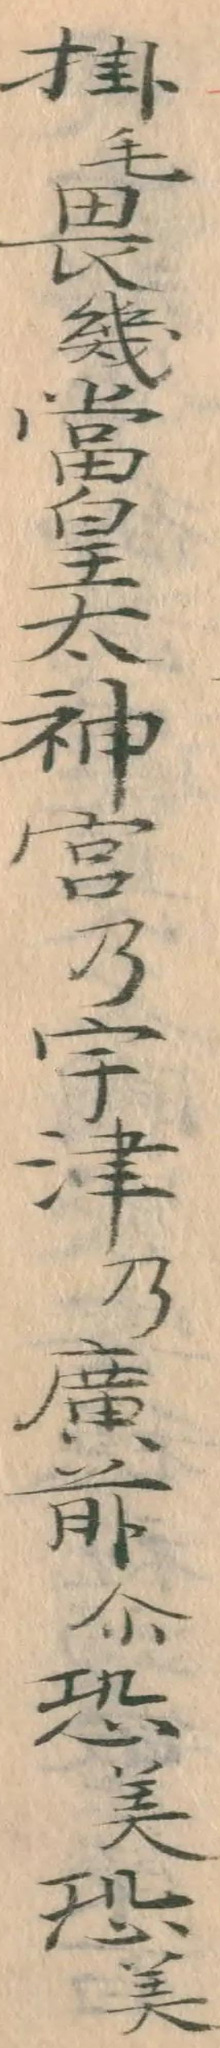掛毛畏幾當皇太神宮乃宇津乃廣前尒恐美恐美
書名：賀茂社記録. 第72冊
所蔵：国立国会図書館 National Diet Library, JAPAN
